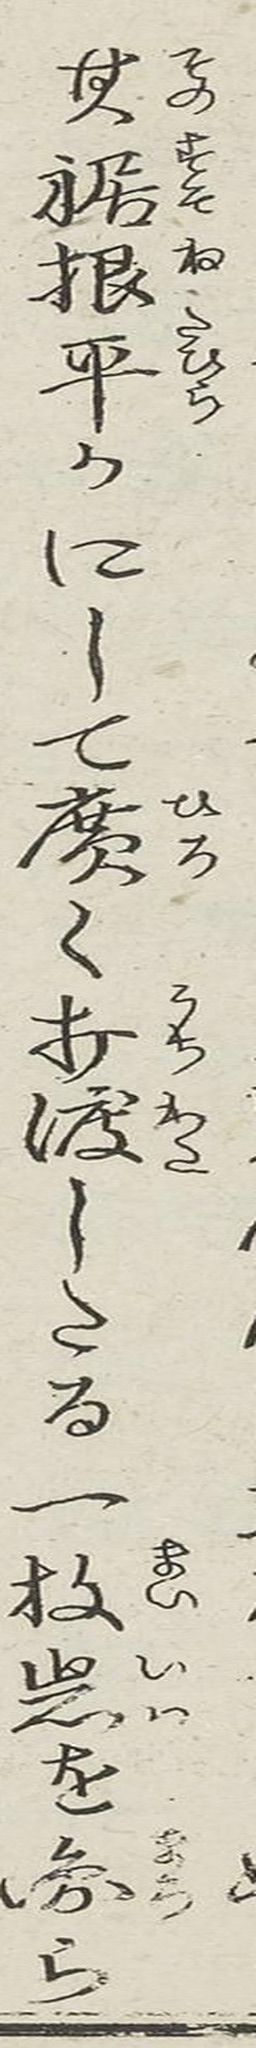其裾根平かにして廣く打渡したる一枚岩を圓ら
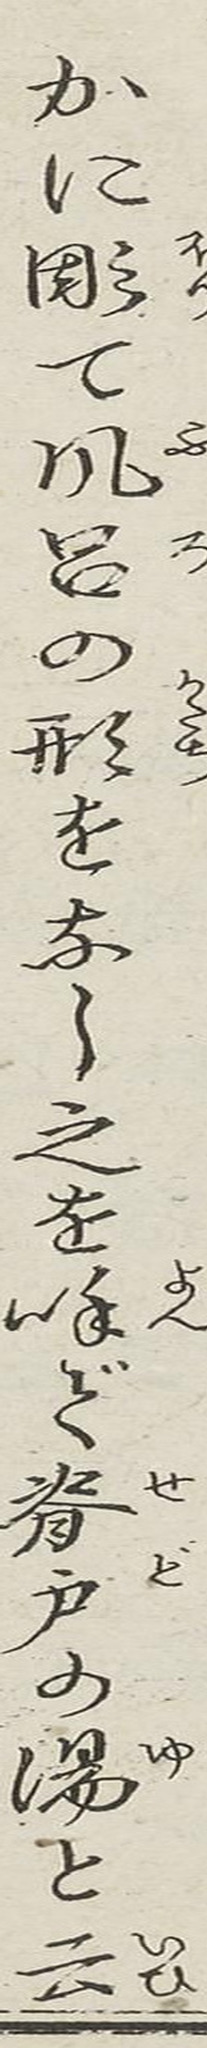かに彫て風呂の形をなし之を呼で背戸の湯と云
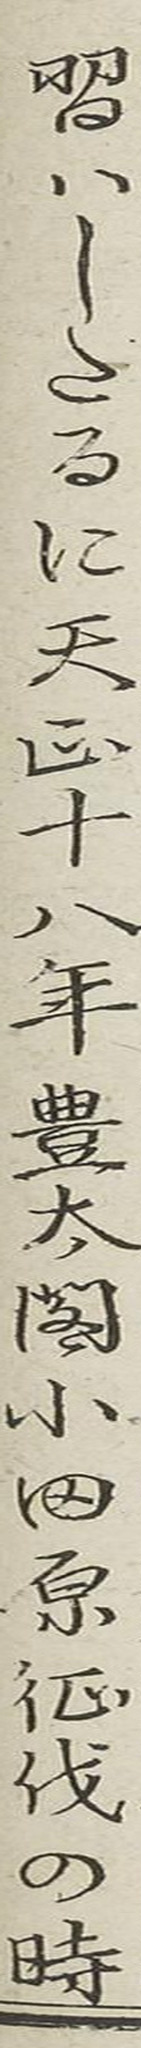習はしたるに天正十八年豊太閤小田原征伐の時
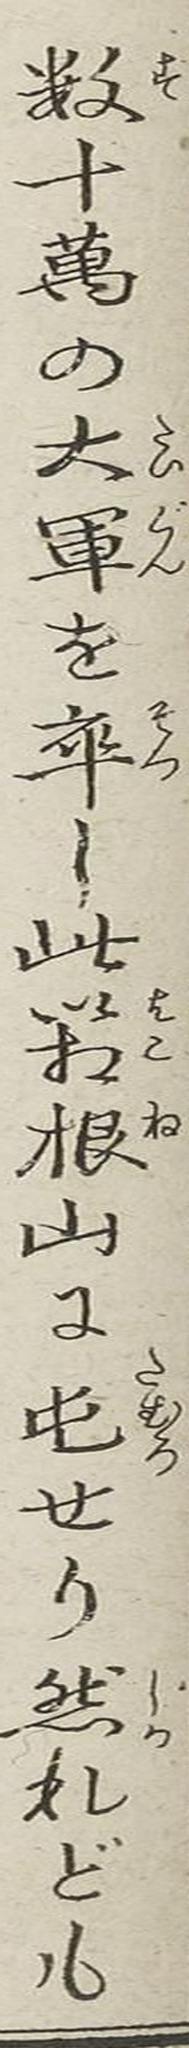数十萬の大軍を卒し此箱根山に屯せり然れども
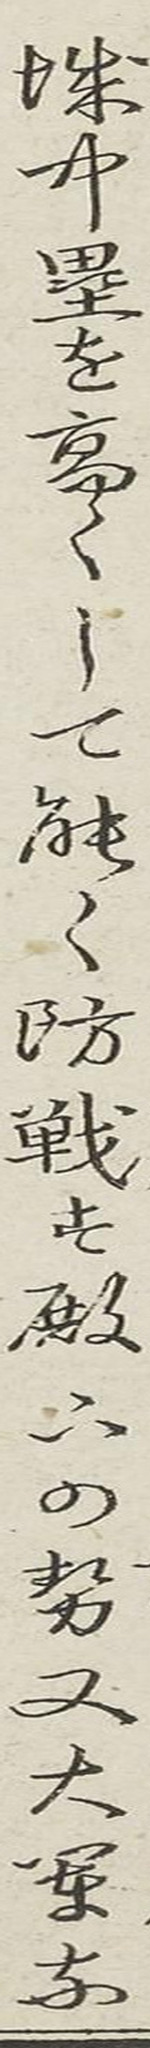城中塁を高くして能く防戦す殿下の勢又大軍な
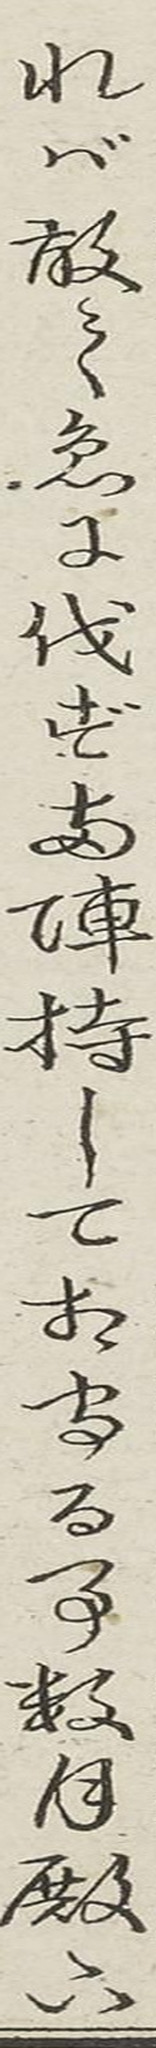れば敢て急に伐ず留陣持して相守る事数月殿下
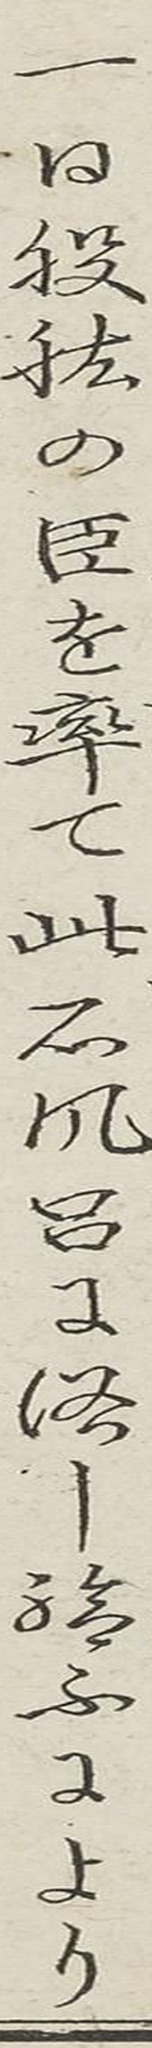一日股肱の臣を率て此石風呂に浴し給ふにより
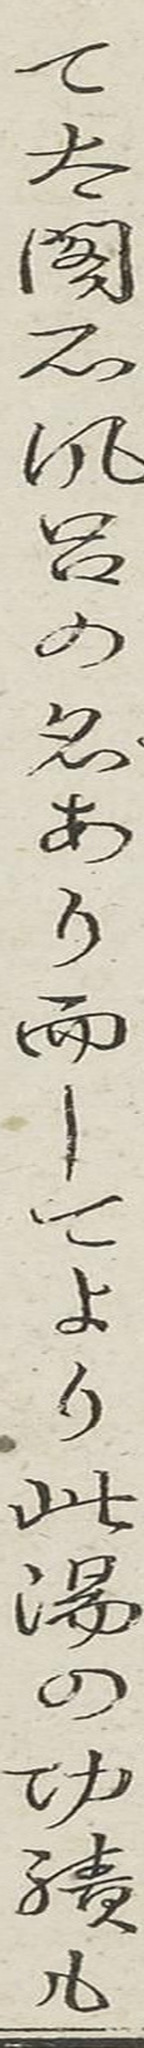て太閤石風呂の名あり而してより此湯の功績も
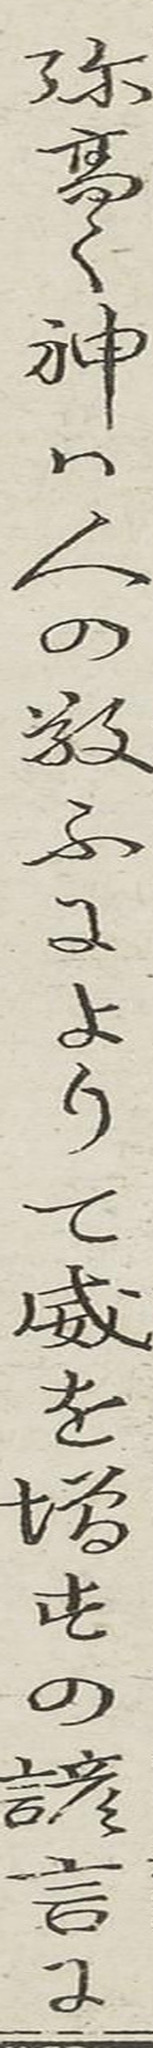弥高く神は人の敬ふによりて威を増すの諺言に
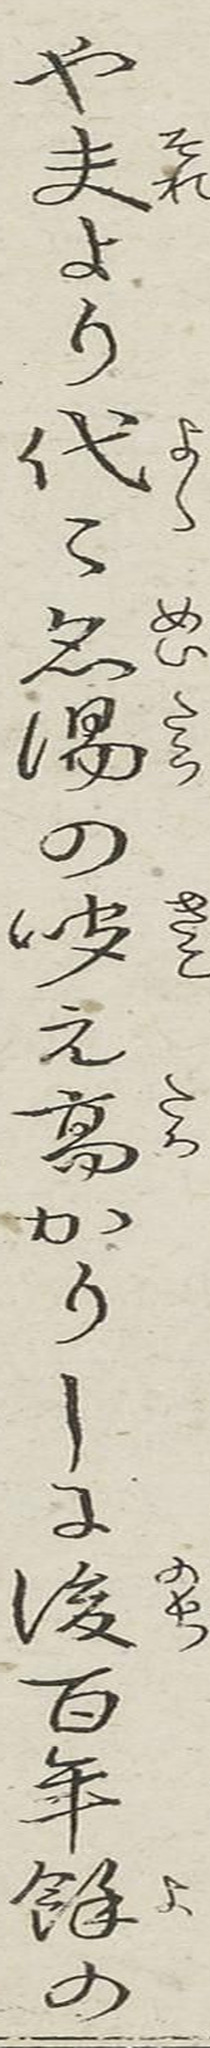や夫より代々名湯の聞え高かりしに後百年餘の
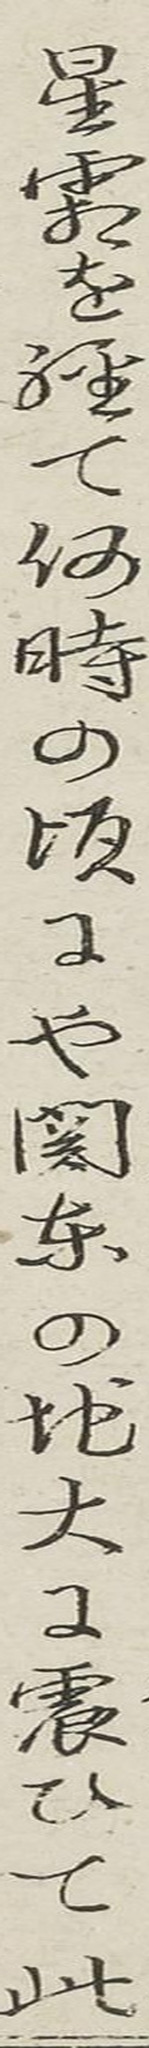星霜を経て何時の頃にや関東の地大いに震ひて此
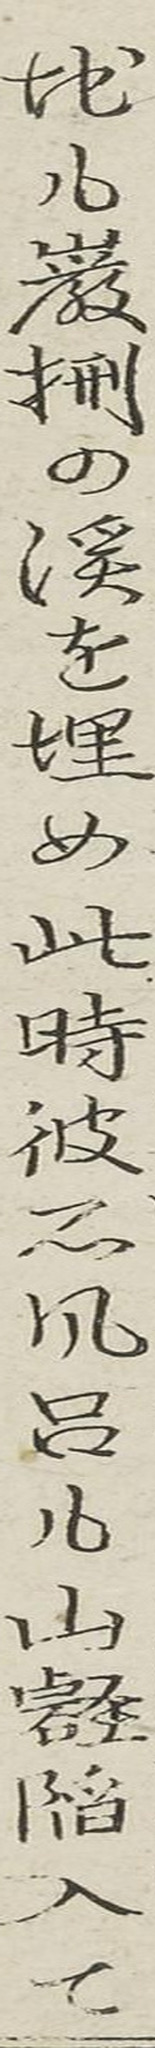地も巌硎？の溪を埋め此時彼石風呂も山壑陥入て
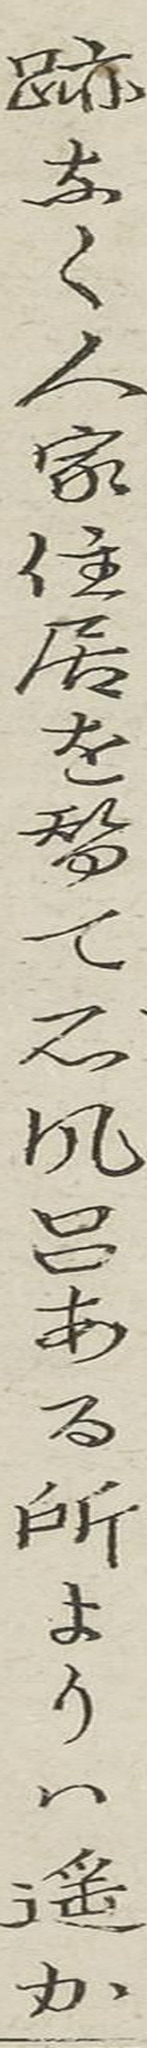跡なく人家住居を替て石風呂ある所よりは遥か

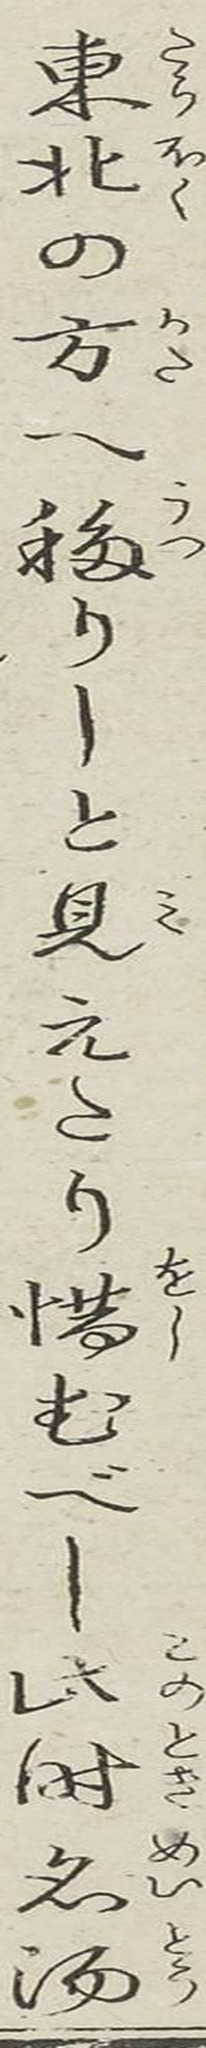東北の方へ移りしと見えたり惜むべし此時名湯
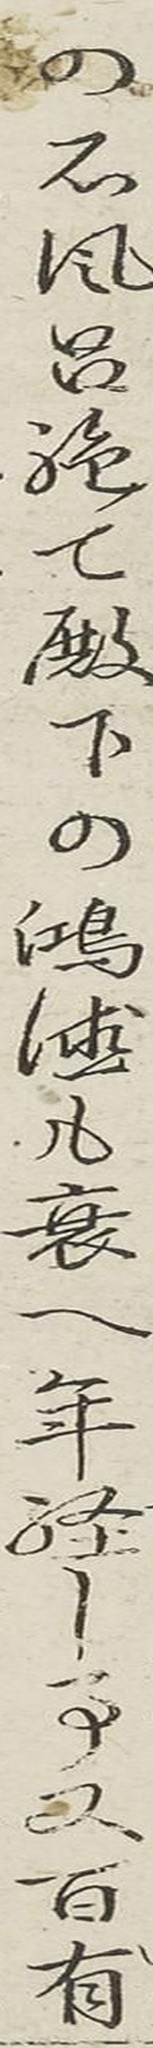の石風呂絶て殿下の鴻徳も衰へ年経し事又百有
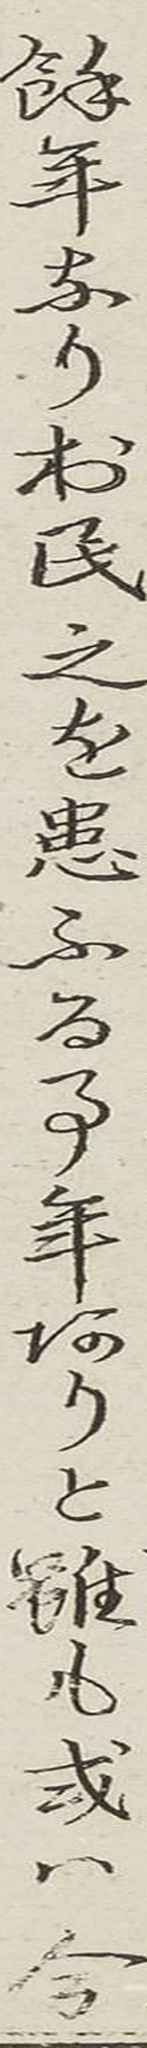余年なり村民之を患ふる事年ありと雖も或は今
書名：箱根温泉誌　全
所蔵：東京大学地震研究所図書室 Earthquake Research Institute Library, The University of Tokyo, JAPAN
